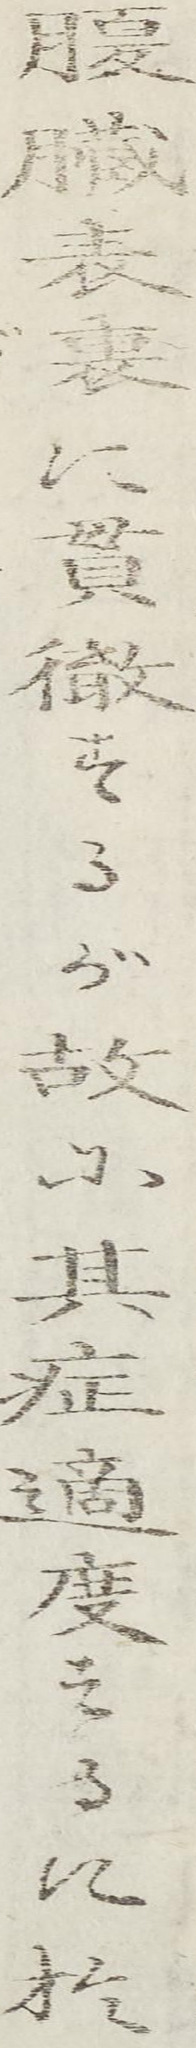腹蔵表裏に貫徹するが故に其症適度するに於
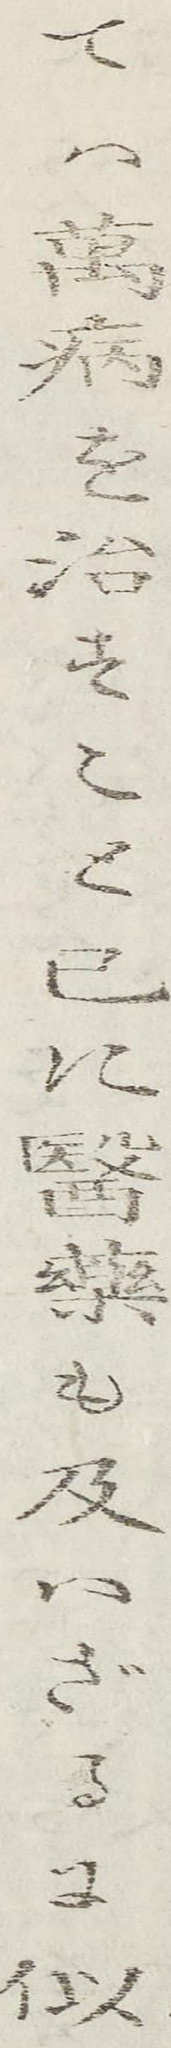ては万病を治すこと已に医薬も及はざるに似
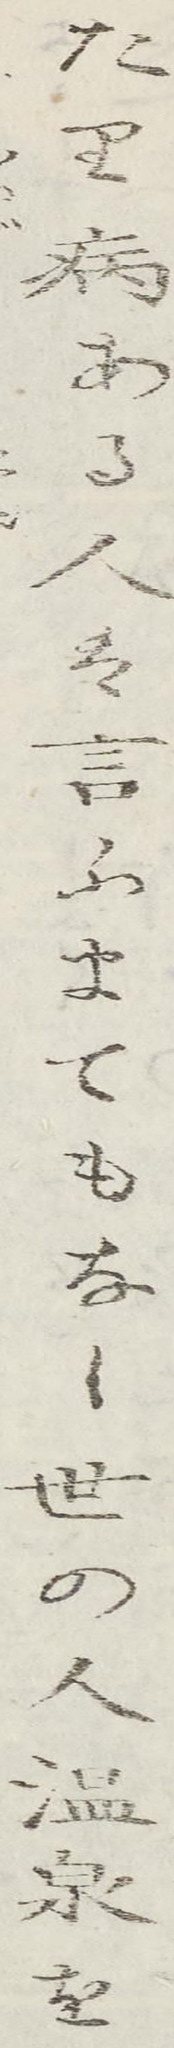たり病ある人は言ふまてもなし世の人温泉を
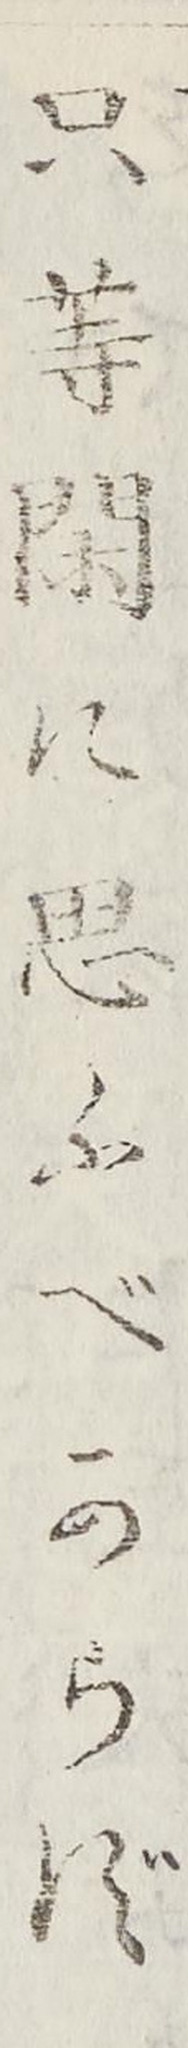只等閑に思ふべからず
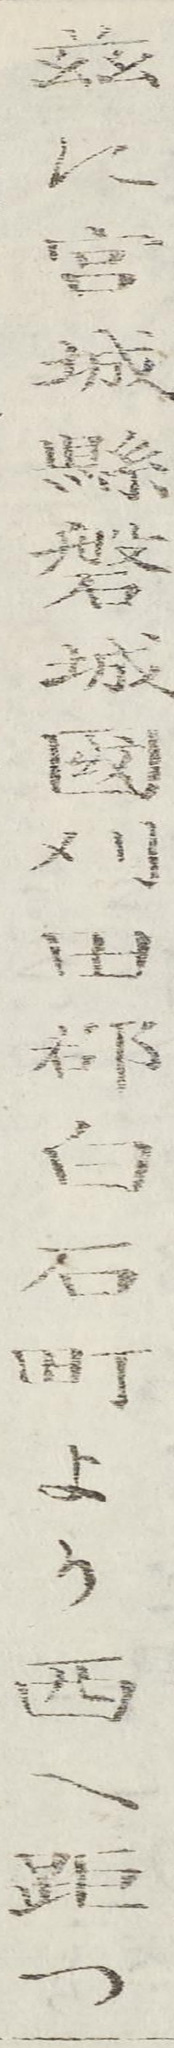茲に宮城県磐城国刈田郡白石町より西へ距つ
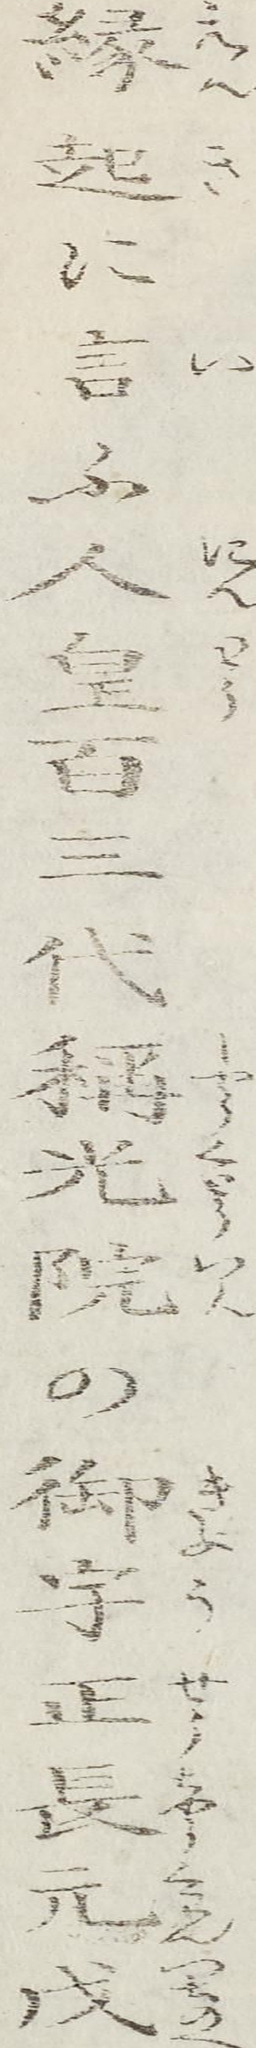縁起に言ふ人皇百三代称光院の御宇正長元戊
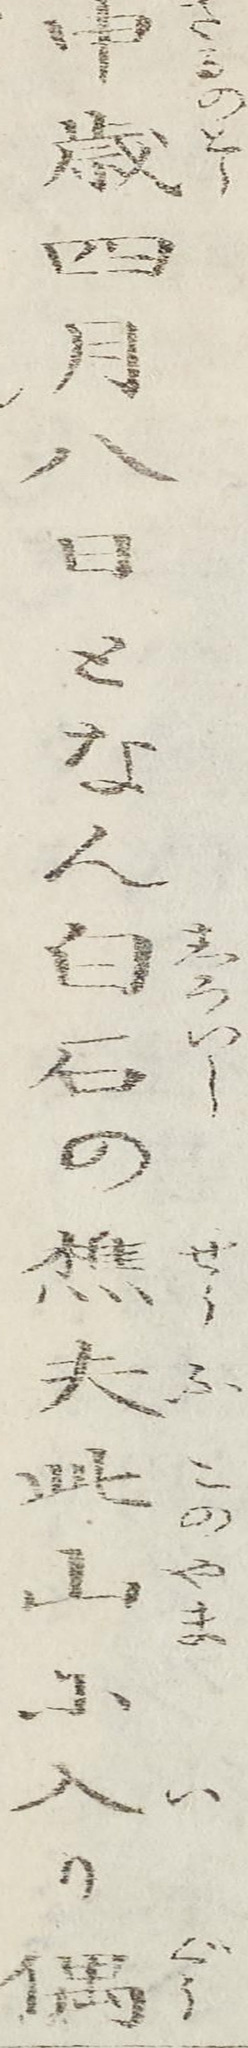申歳四月八日となん白石の樵夫此山に入り偶
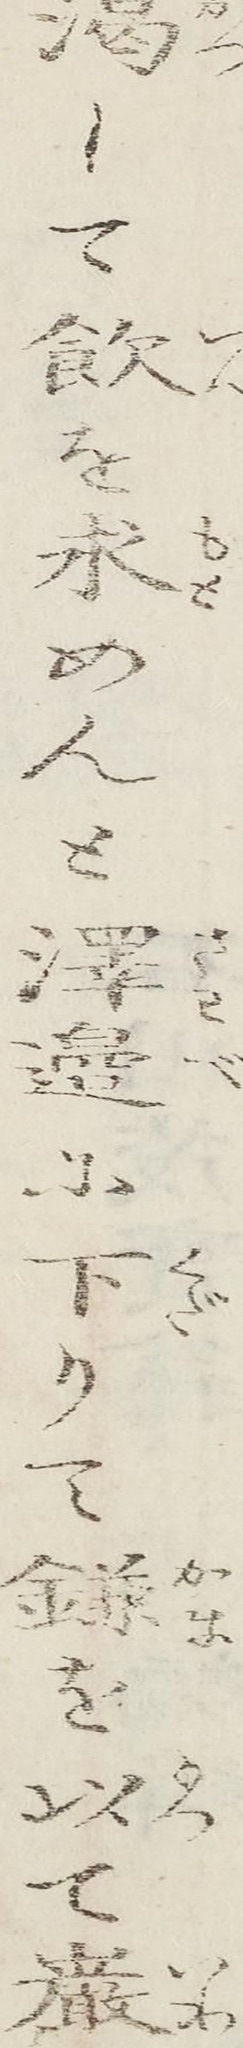渇して飲を求めんと沢辺に下りて鎌を以て巌
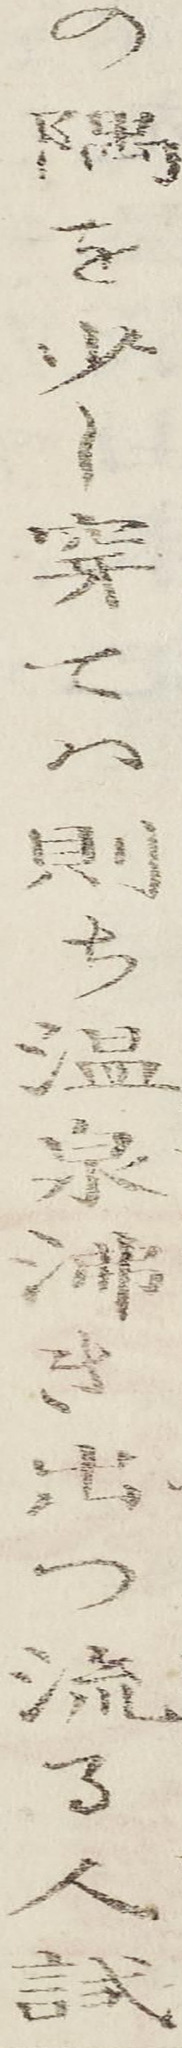の隅を少し穿ては則ち温泉沸き出つ流る人試
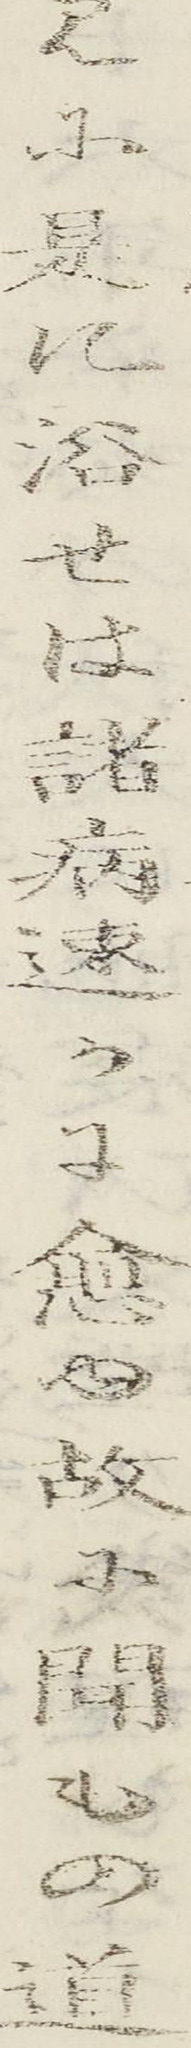みに是に浴せは諸病速かに愈ゆ故に聞もの道
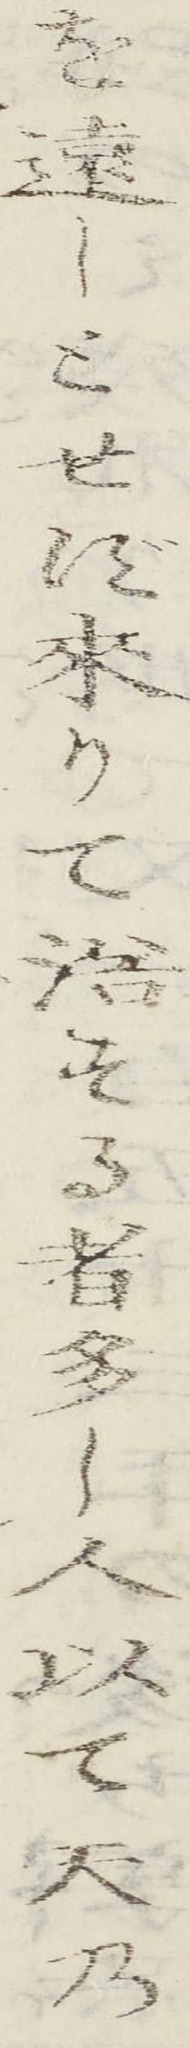を遠しとせず来りて浴する者多し人以て天の
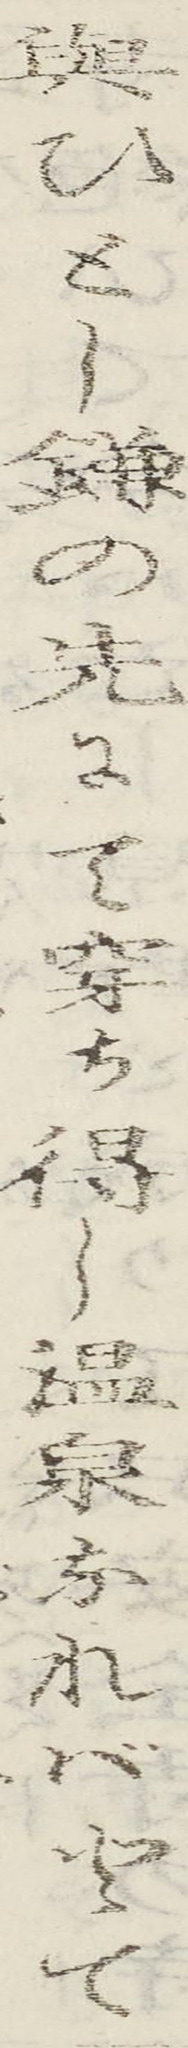与ひとし鎌の先にて穿ち得し温泉なればとて
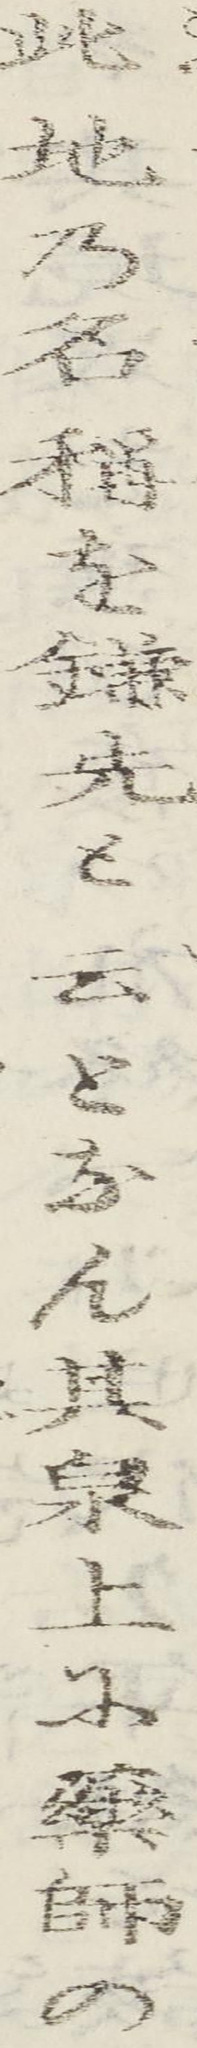此地の名称を鎌先と云となん其泉上に薬師の
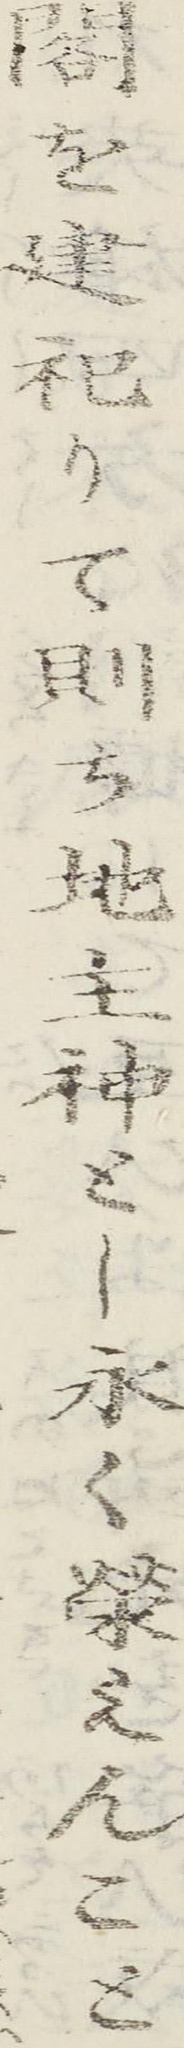閣を建祀りて則ち地主神とし永く栄えんこと
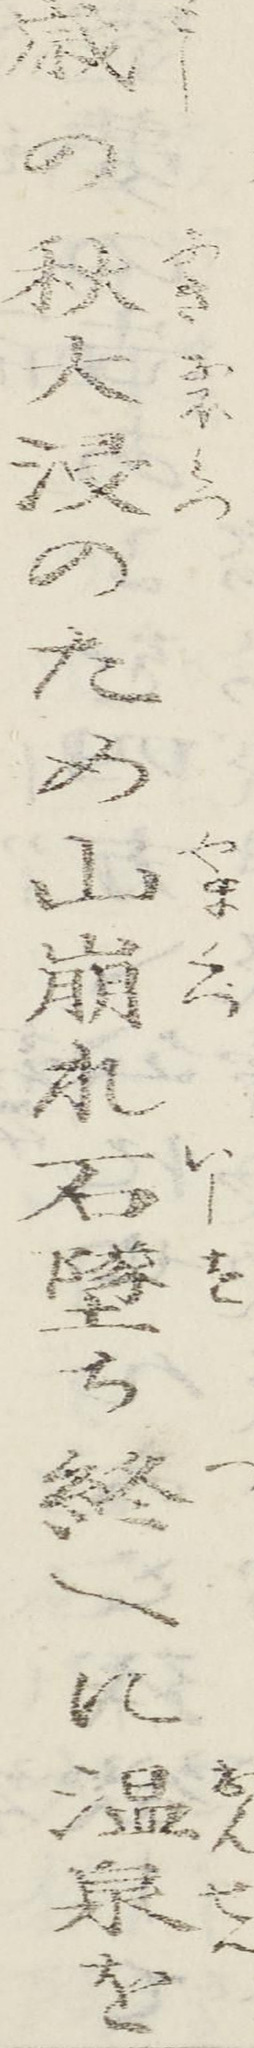歳の秋大浸のため山崩て石墜ち終へに温泉を
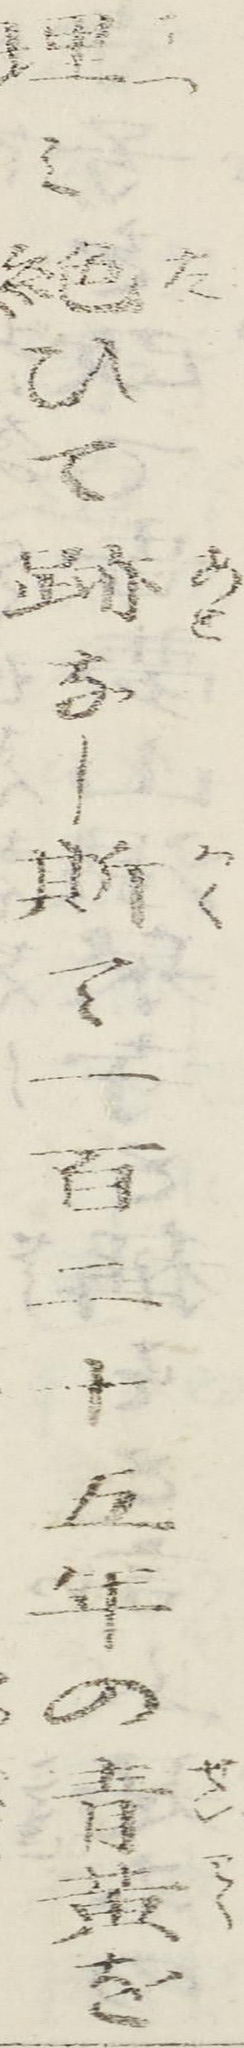埋み絶ひて跡なし斯て一百二十五年の青黄を
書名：鎌先温泉由來記
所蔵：東京大学地震研究所図書室 Earthquake Research Institute Library, The University of Tokyo, JAPAN
